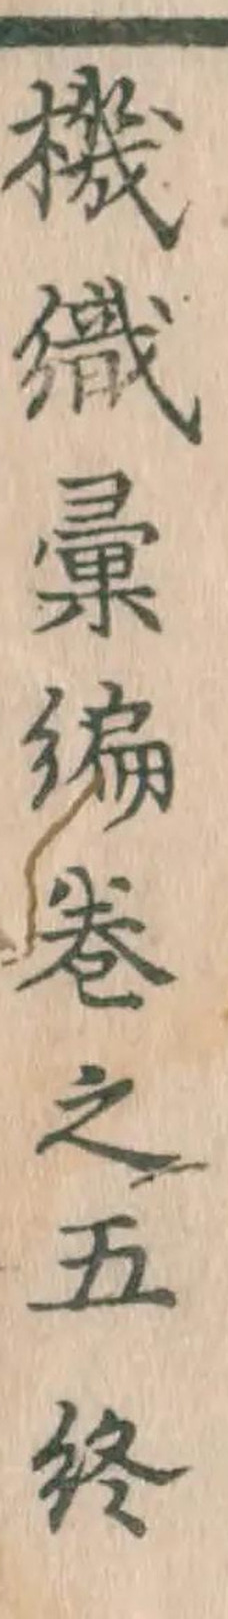機織彙編巻之五終

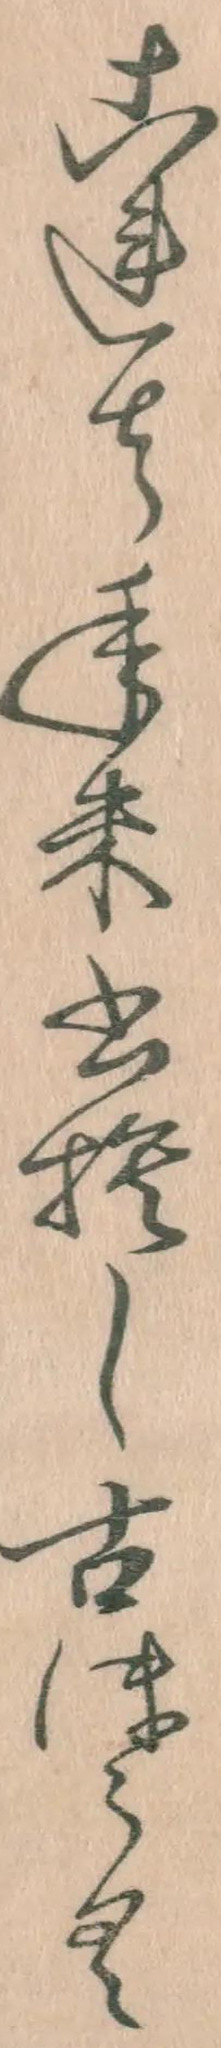これは年来書捨し古ほうく
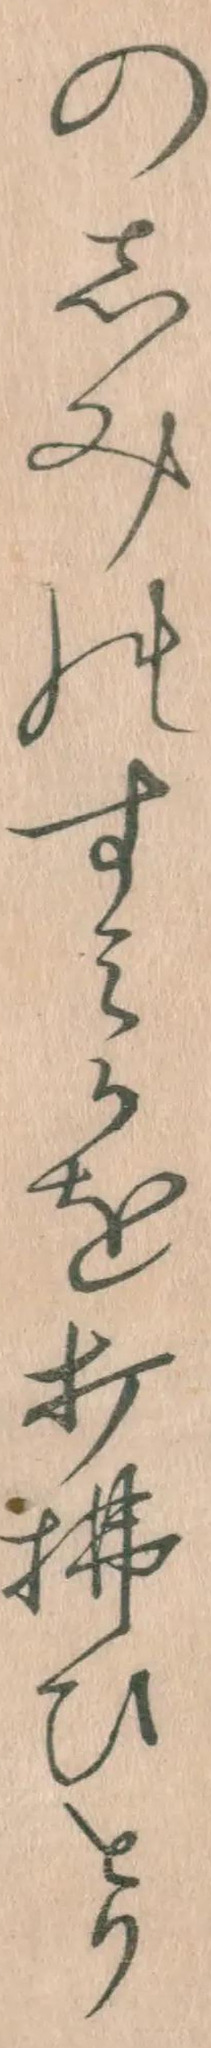のしみのすみかを打払ひとり
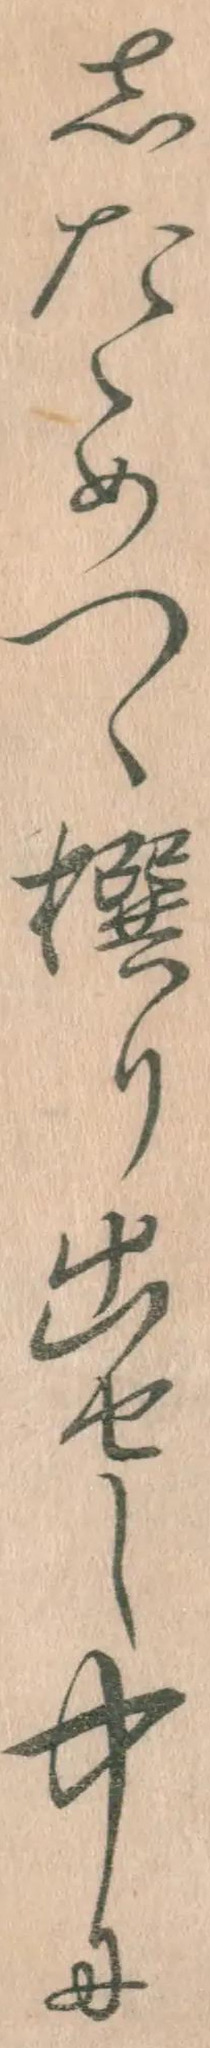したゝめつゝ撰り出せし中に
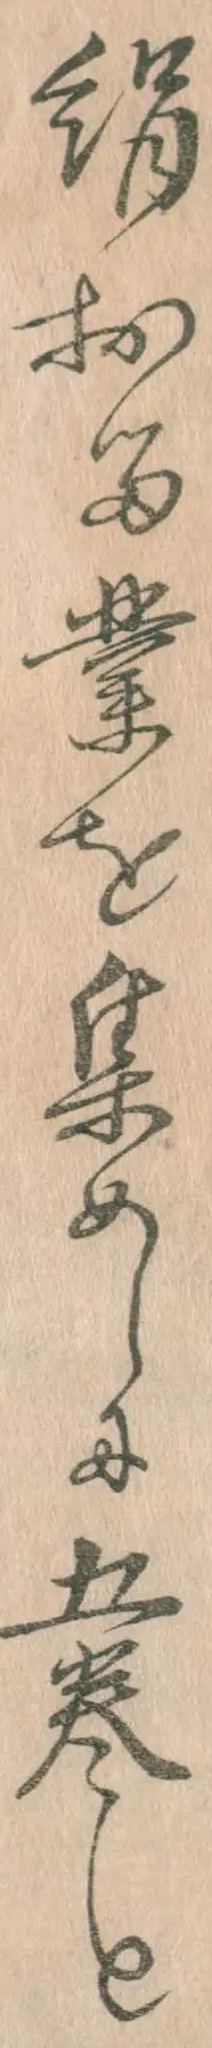絹おる業を集めしに五巻と
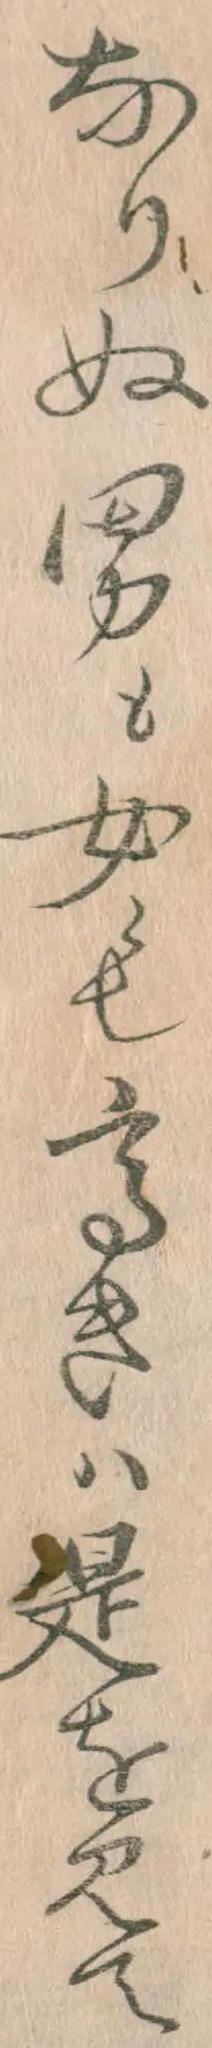なりぬ男も女も高きは是を見て
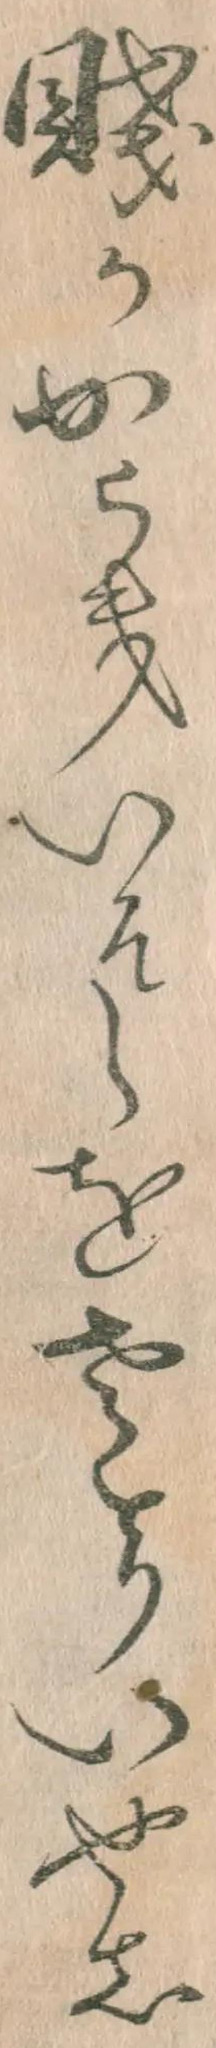賤かからきいそしをさとりいやし
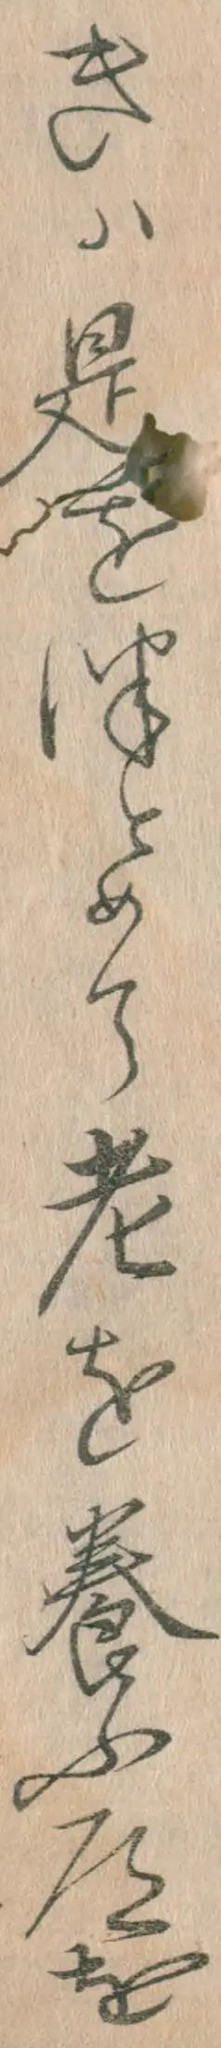きは是をつとめて老を養ふ道を

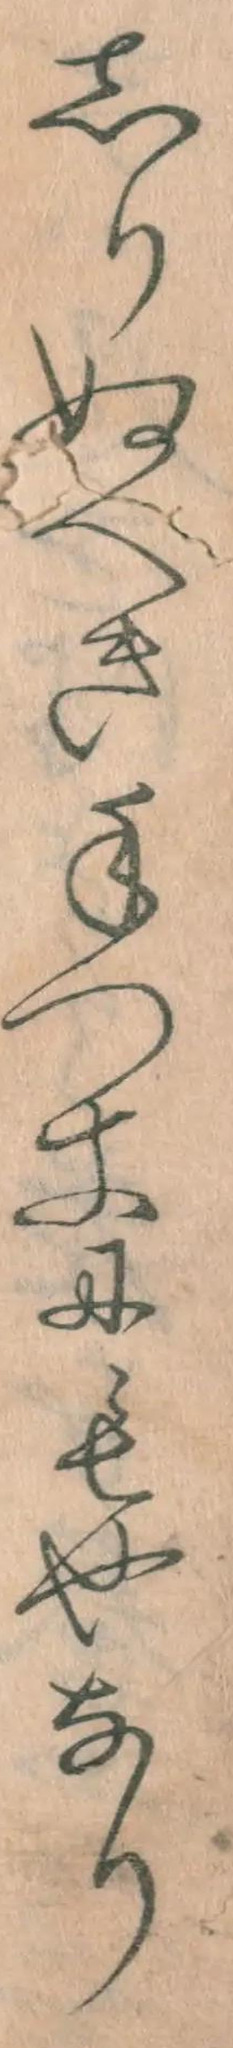しりぬへき手つきにもやなり
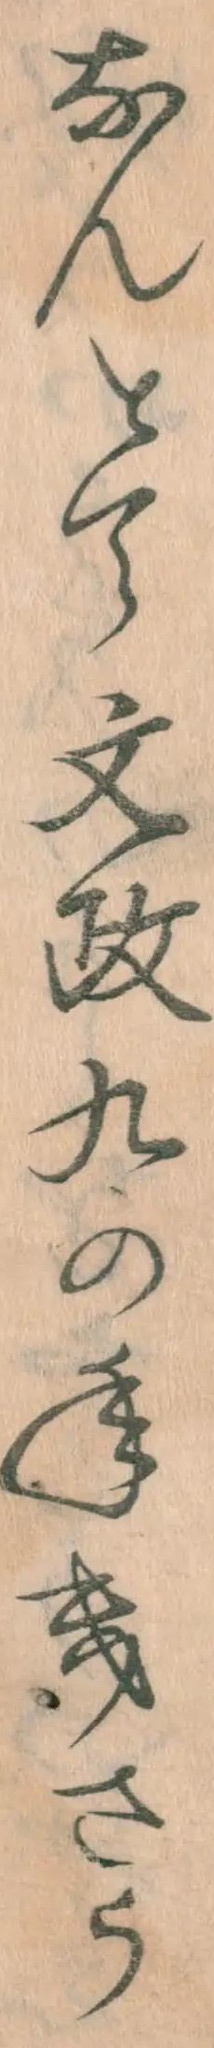なんとて文政九の年きさら
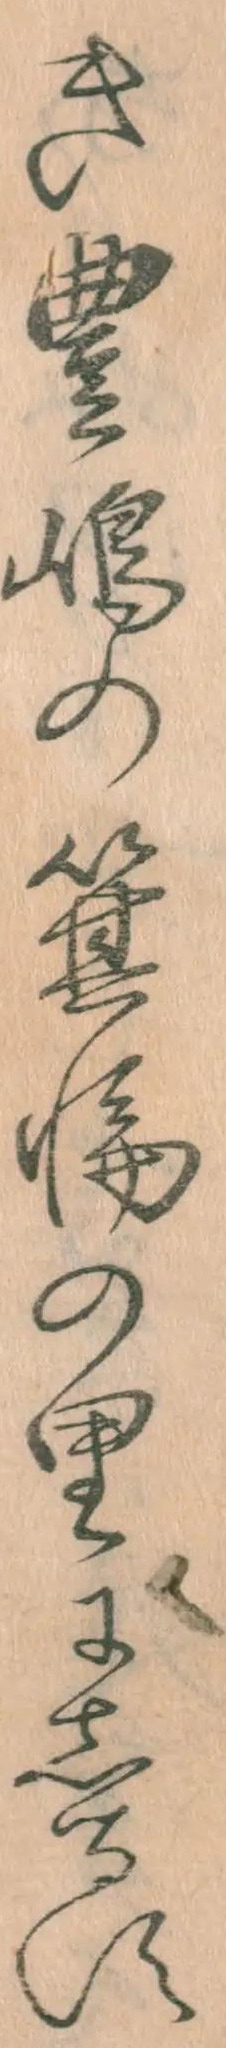き豊島の箕輪の里にしるす
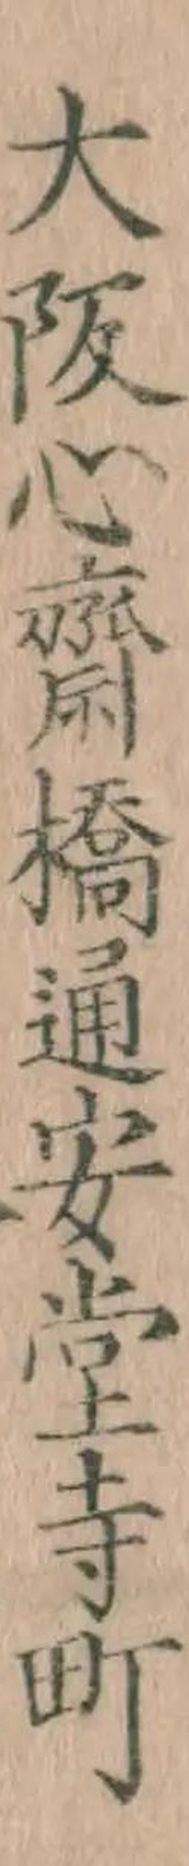大阪心斎橋通安堂寺町
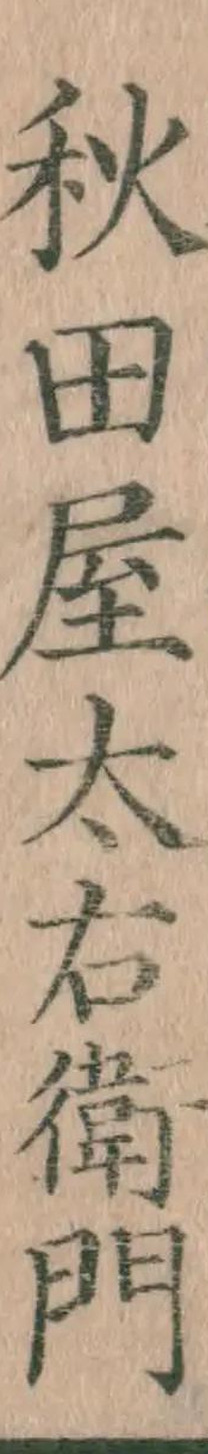秋田屋太右衛門
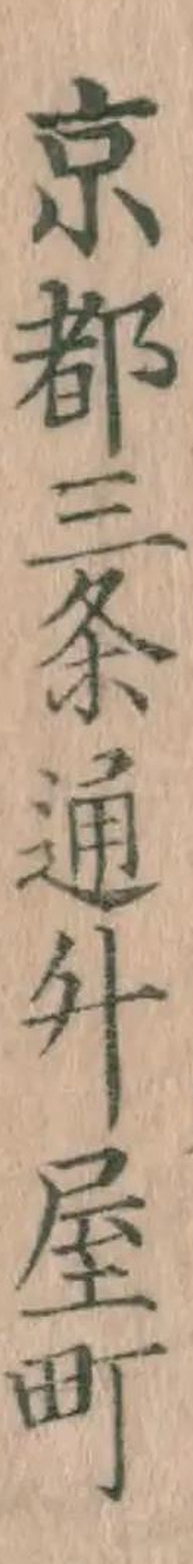京都三条通升屋町
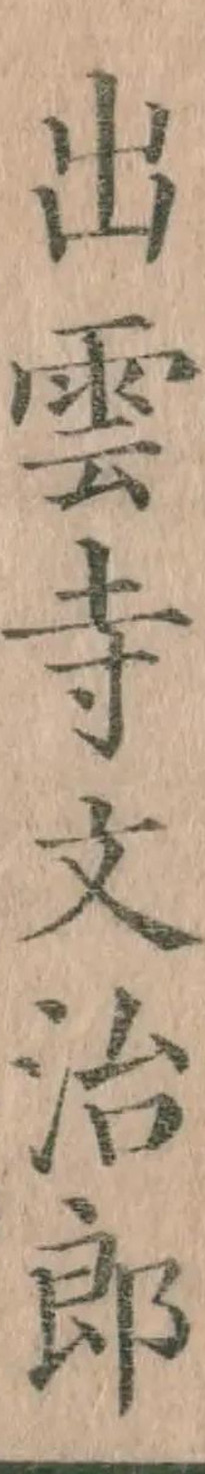出雲寺文治郎
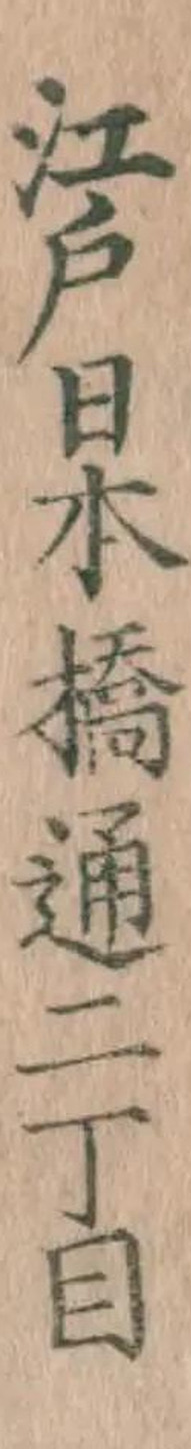江戸日本橋通二丁目
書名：機織彙編 5巻. [2]
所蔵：国立国会図書館 National Diet Library, JAPAN
